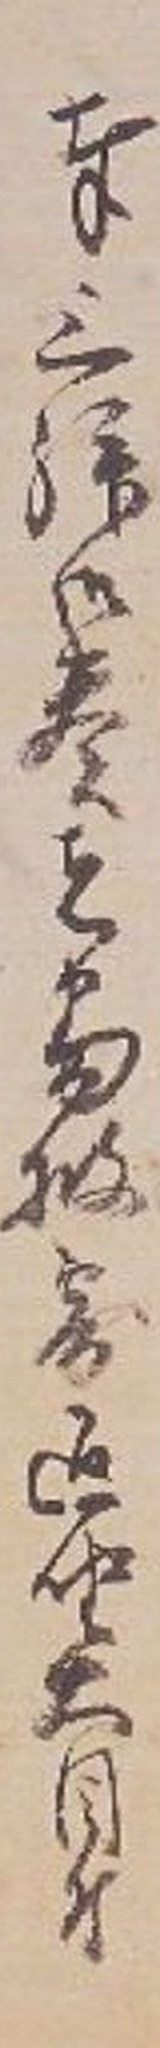奉三拝御奏者番披露退座大目付
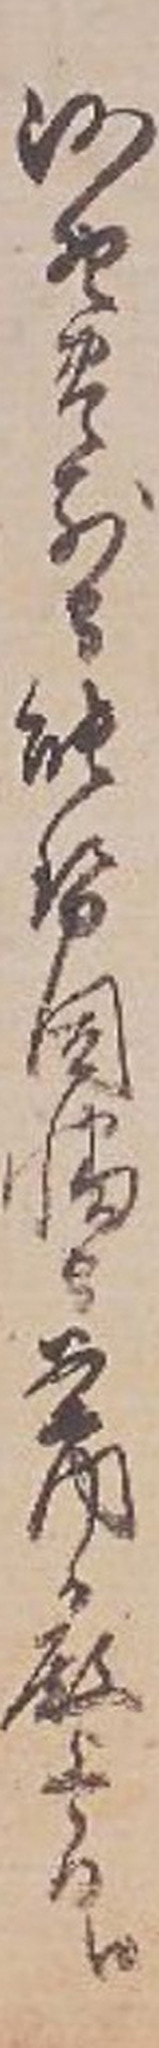河野豊前守能勢因幡守案内而殿上之間え

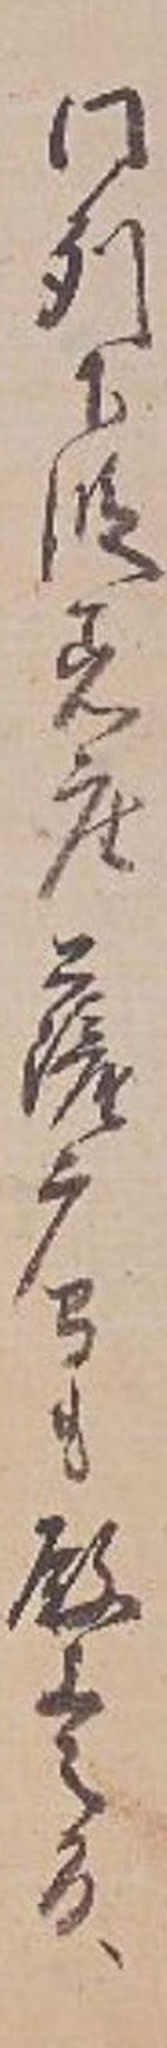同列下段着座薩摩守も殿上之間
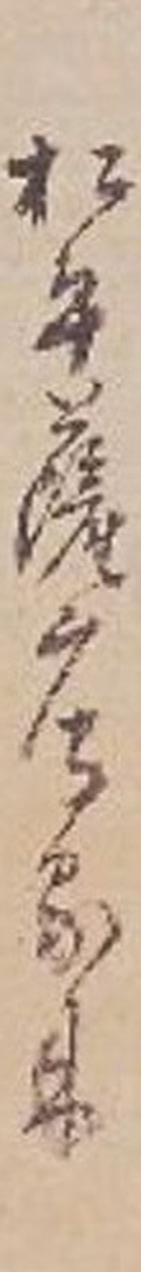松平薩摩守家来
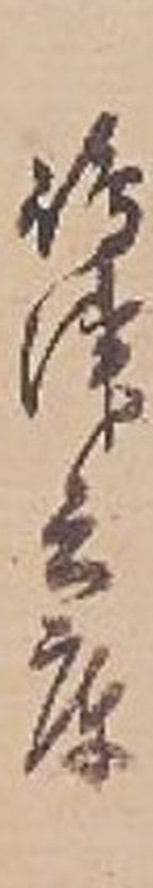嶋津兵庫
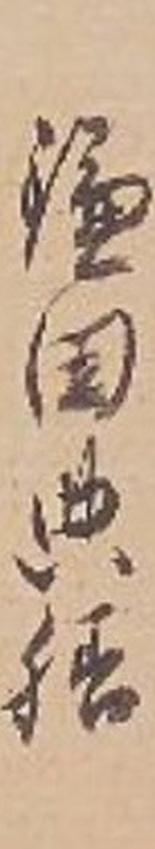鑑田典膳
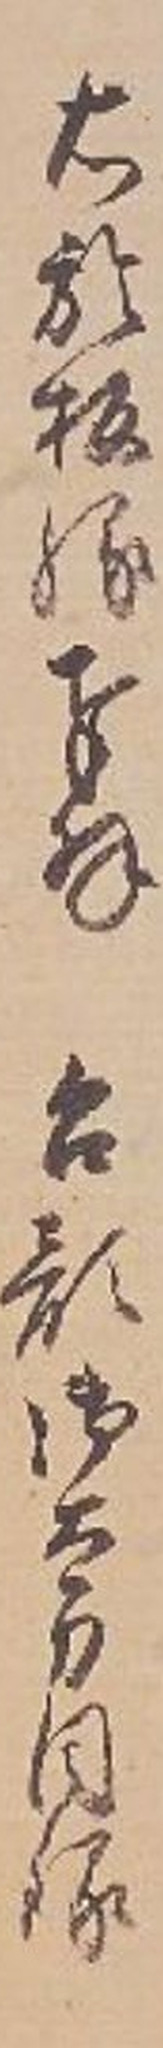右於板縁奉拝御太刀目録
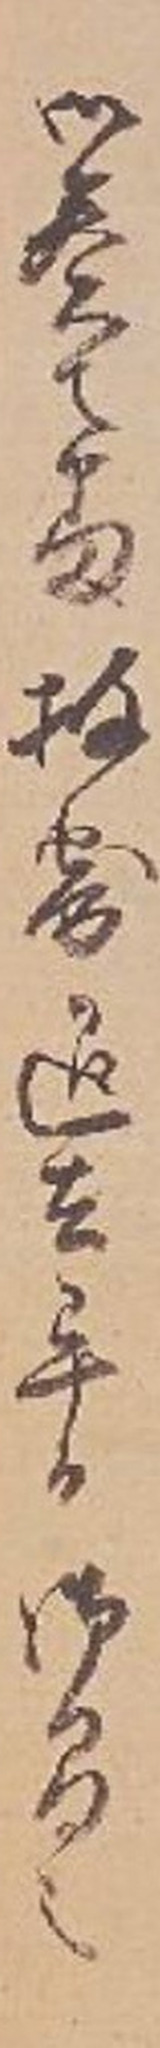御奏者番披露退去畢て御間之
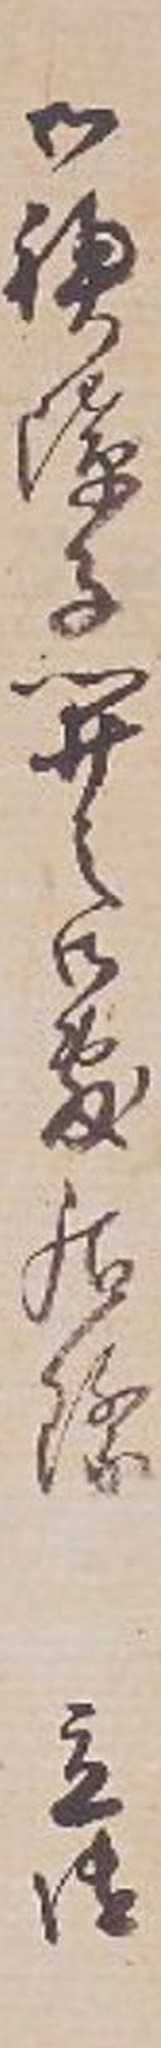御襖障子開之御敷居際立御
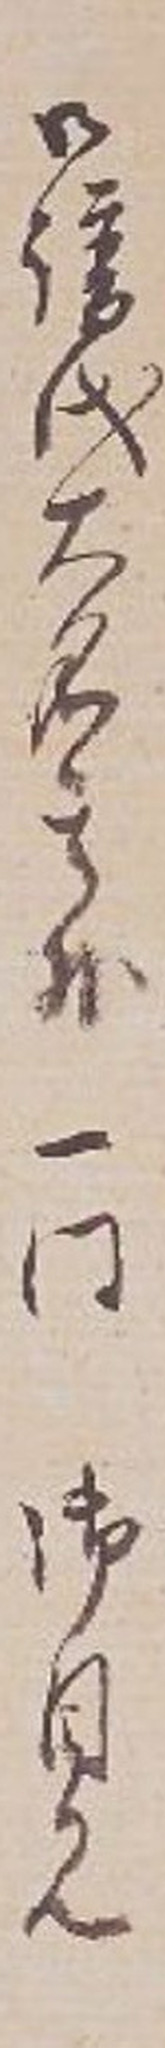御譜代大名其外一同御見
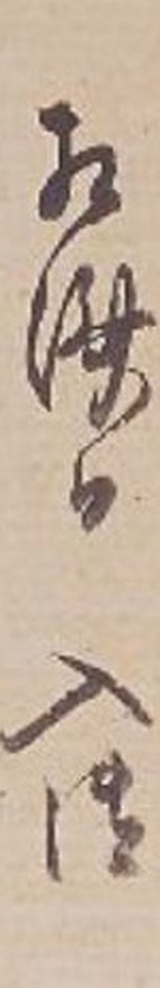相済而入御
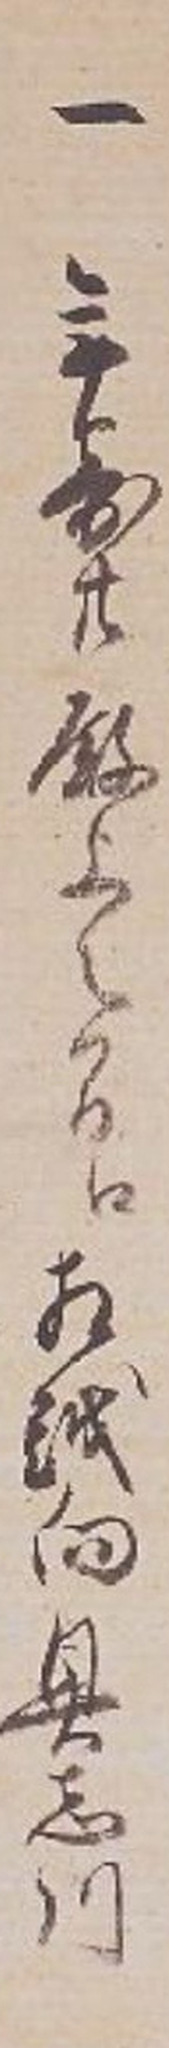一年寄共殿上之間え相越向具志川
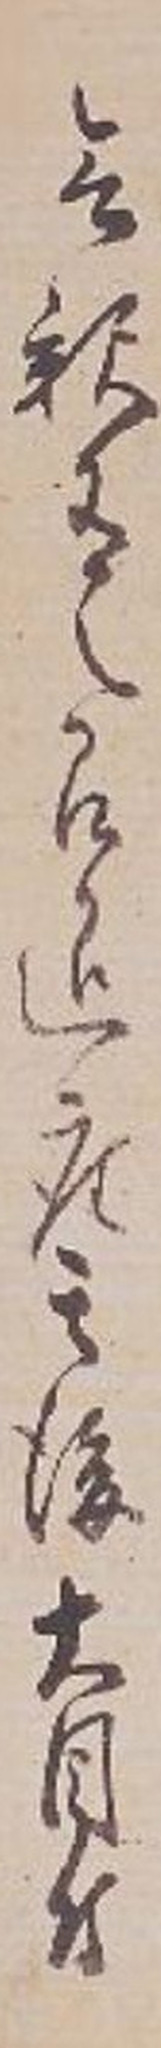会釈有之罷退座そ其後大目付
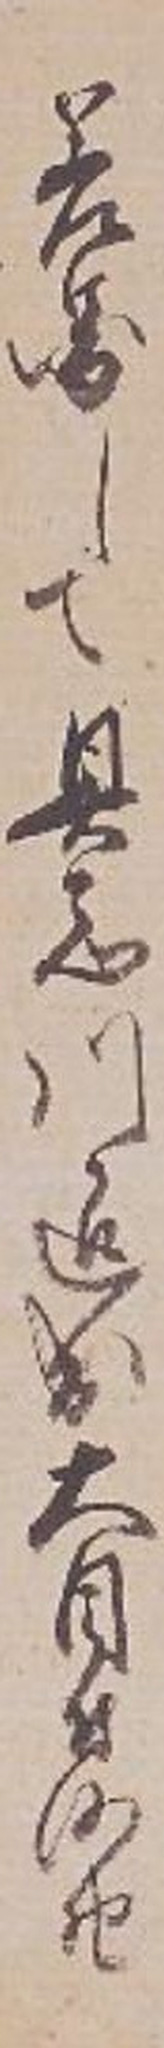差図して具志川退出大目付河野

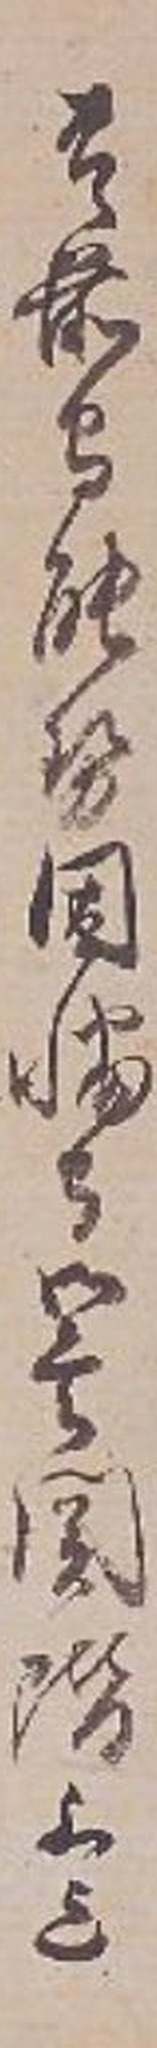豊前守能勢因幡守御玄関階上迄
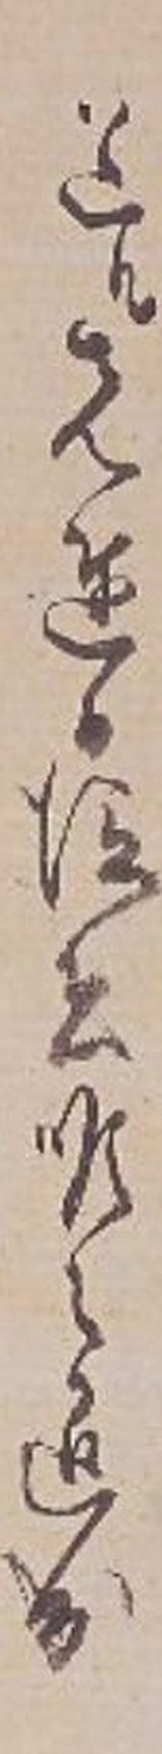送る先達而従者順々退出
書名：琉球人来朝記 三、四
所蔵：University of the Ryukyus Library
